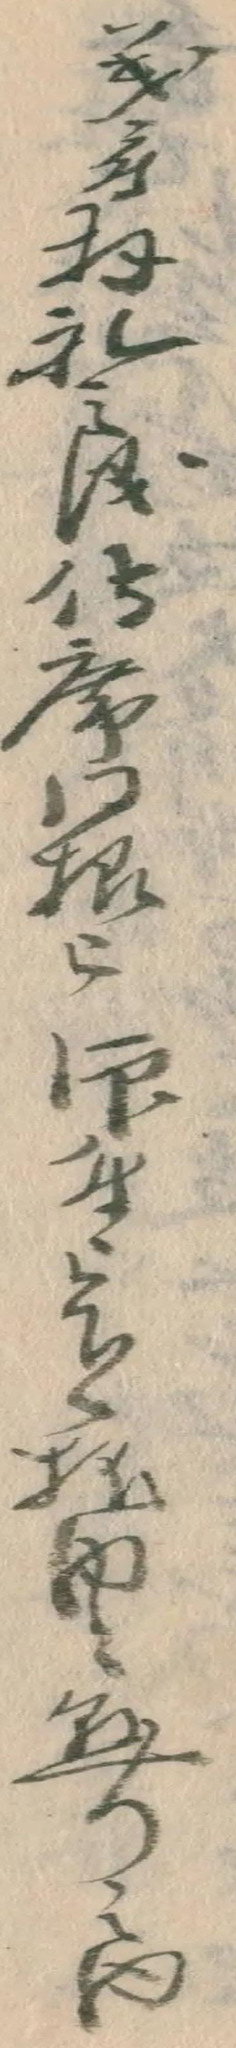義ニ付拝礼之儀侍席同様被仰付被下候様内々懸り之内
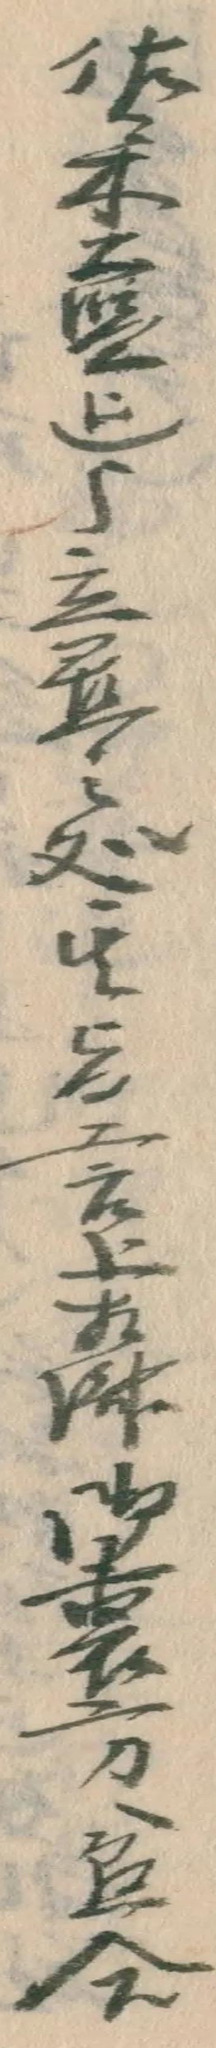佐々木第監迄申立置候処其旨言上相済御裏方へ懸合
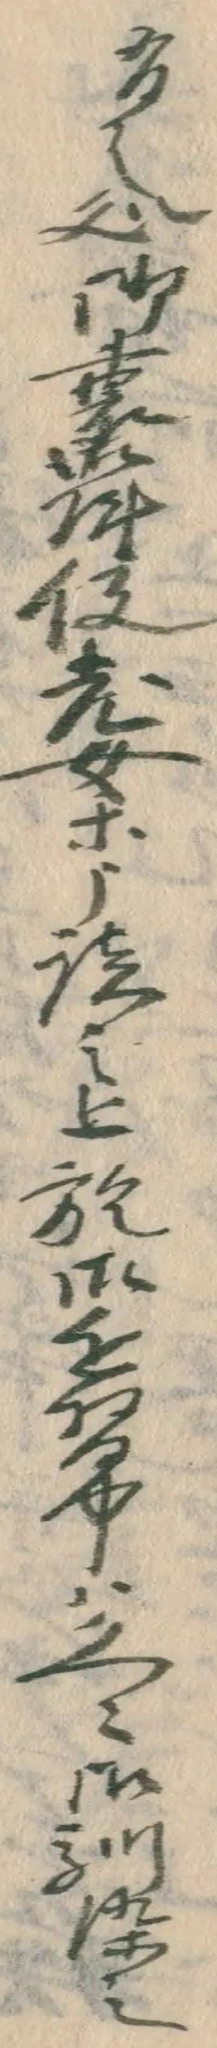有之処御裏御料役老女等申談之上於御近習中ハ久々御馴染之
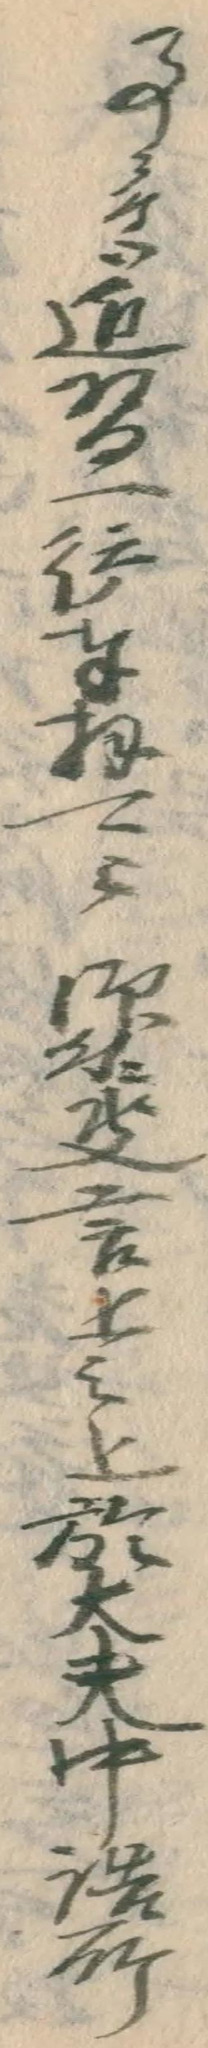事ニ付御近習一統奉拝可被仰付ニ決言上之上於大夫中詰所
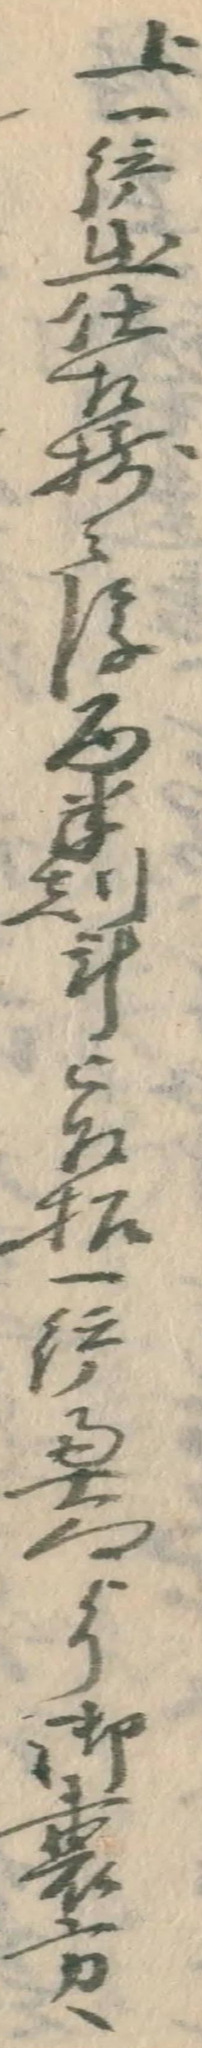上一統出仕相揃候後酉半刻斗被召招一統奥向より御裏方へ
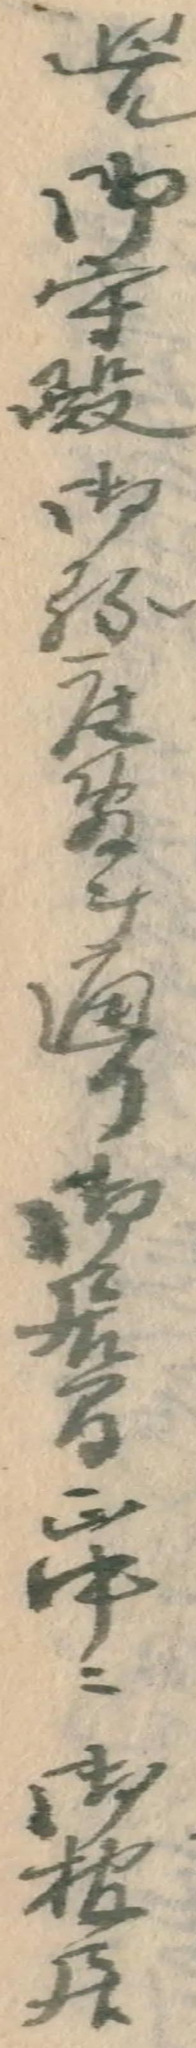廻ル御守殿御縁座敷ヲ通り御居間正中に御棺昇

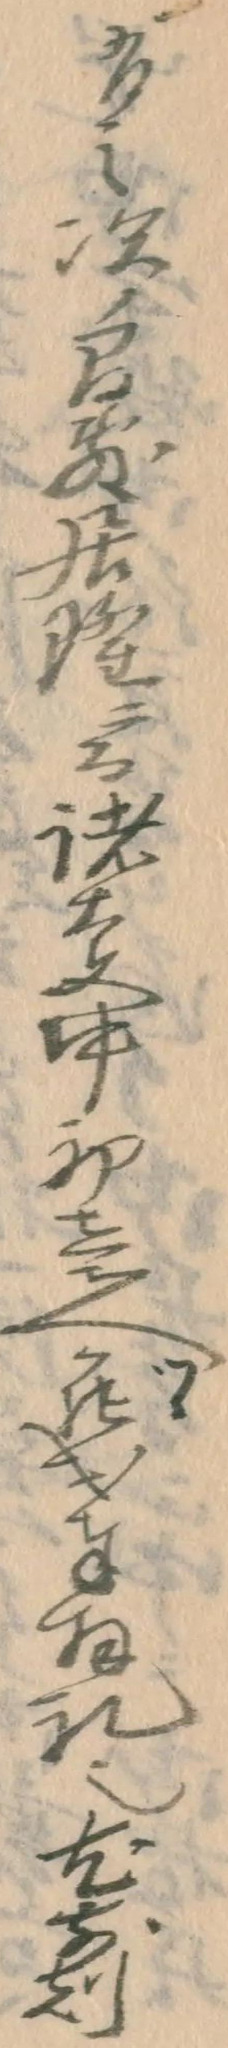有之次ノ間敷居隆ニ而諸中大夫中初壱人ツヽ罷出奉拝礼也尤前刻
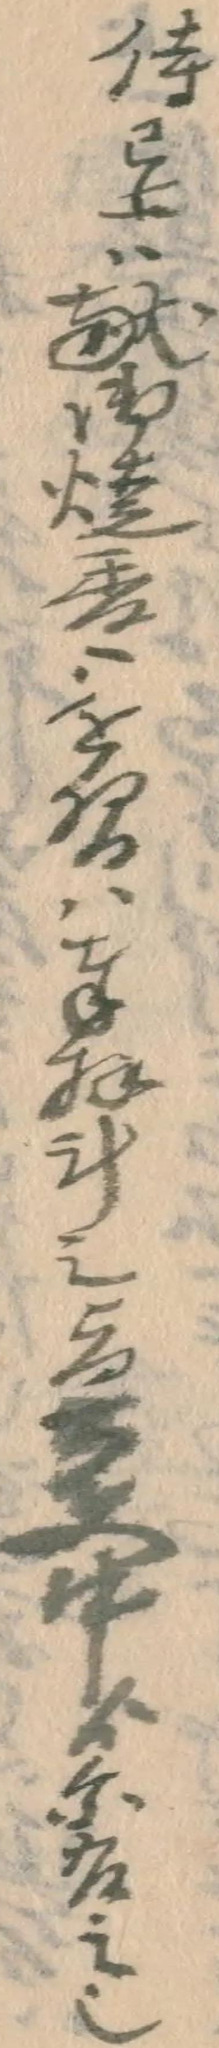侍已上ハ献御焼香御近習ハ奉拝斗之旨大夫中ゟ示有之也
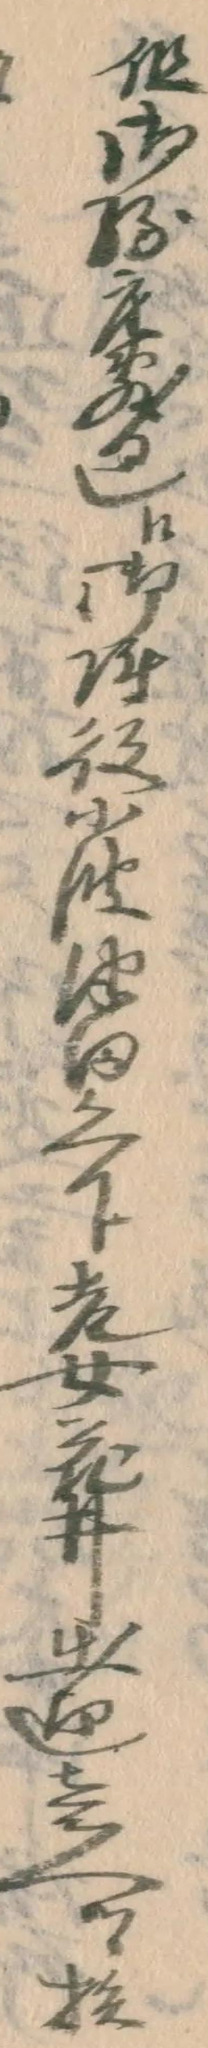但御縁床敷江御附役小波津田久下老女花井出迎壱人ツヽ挨
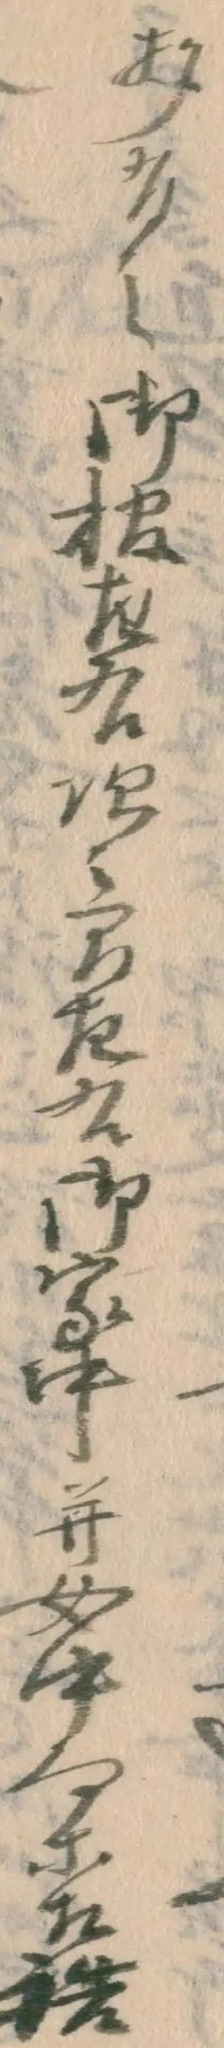拶有之御棺左右次之間左右御家中并女中向等相詰
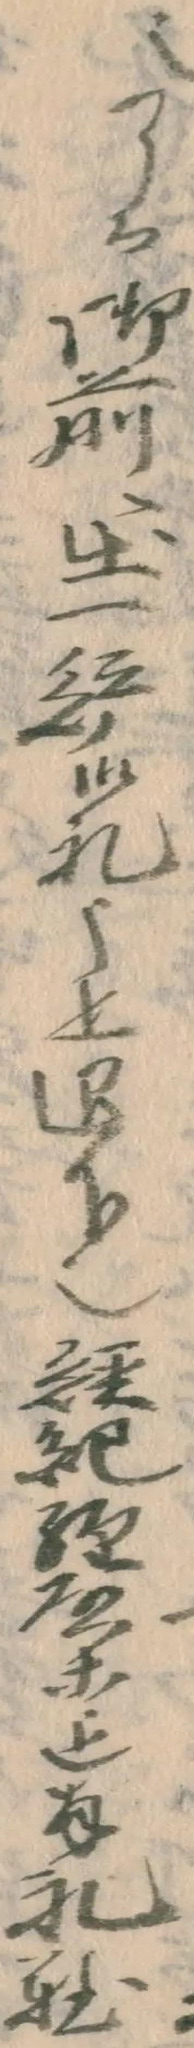之了而御前へ出一統御礼申上退下也経紀経就卿等迄拝礼就
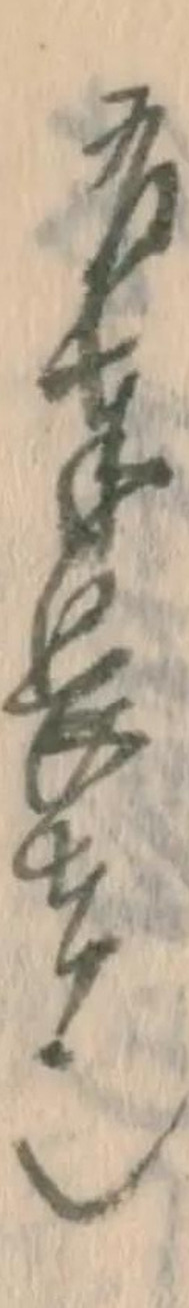有奉畏在也
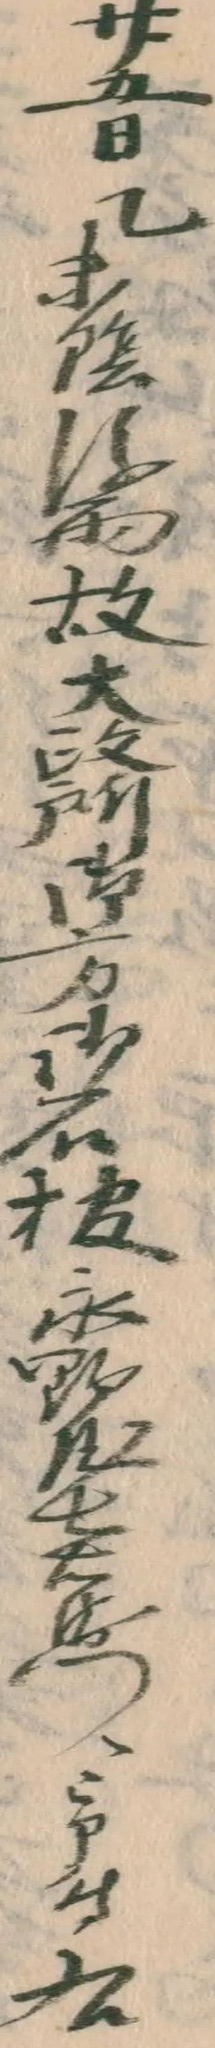廿五日乙未陰後雨故大政所御方御石棺永野屋長右衛門へ被申付右
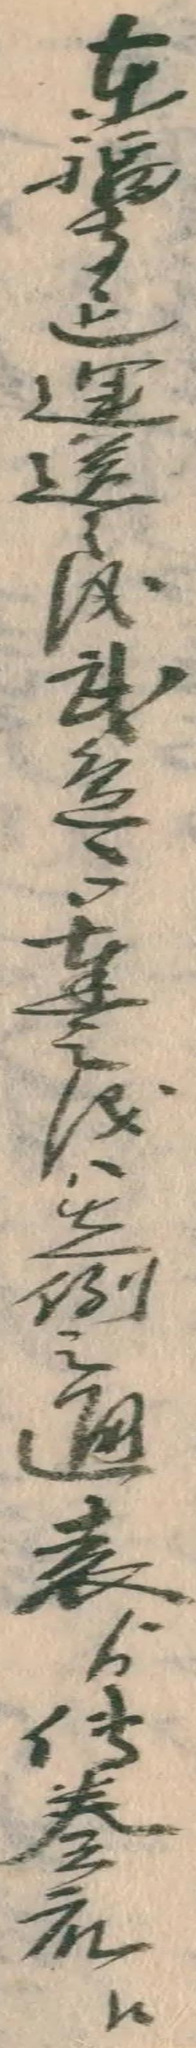東福寺迄運送之儀武邊へ御達之儀ハ先例之通表ゟ傳奏衆え
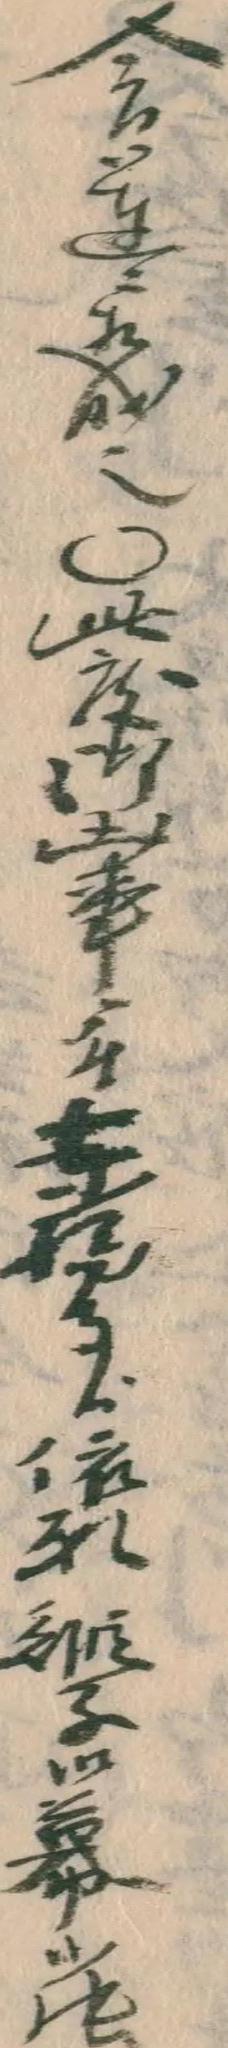今日御達ニ相成也○此度御事ニ付東福寺ゟ依願緞子御幕小張
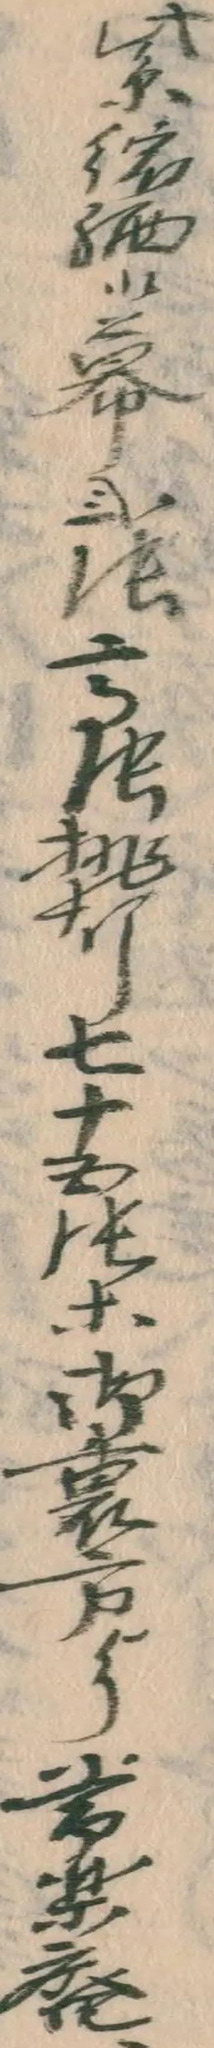紫縮緬御幕弐張高張挑灯七十五張等御裏方より常楽庵へ
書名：賀茂社記録. 第69冊
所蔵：国立国会図書館 National Diet Library, JAPAN
